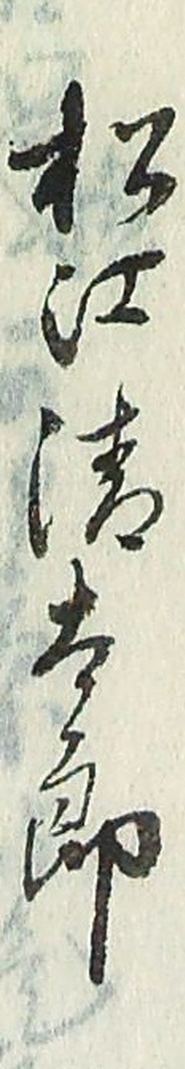松江清太郎
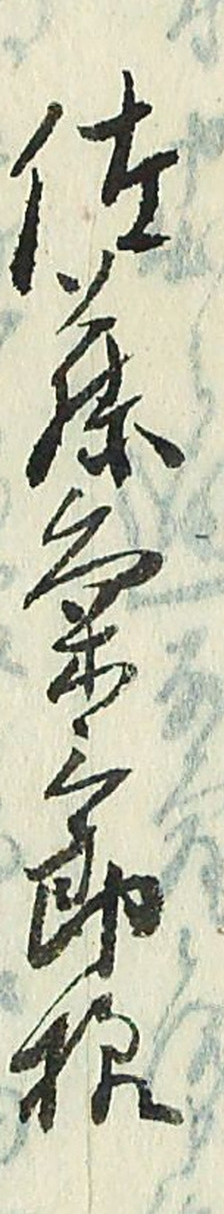佐藤粂三郎様
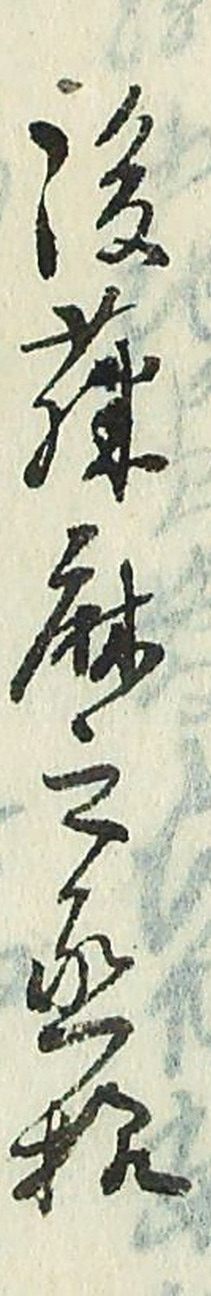後藤麻之丞様
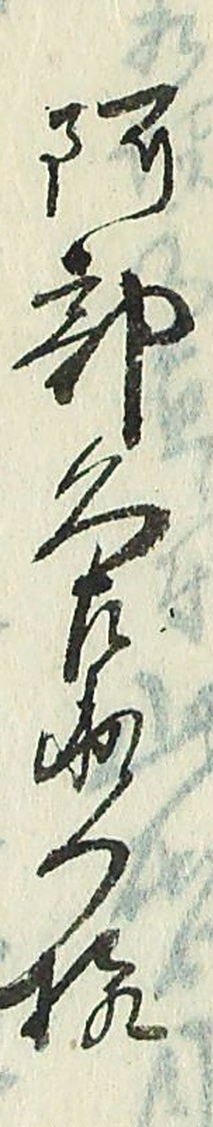阿部久左衛門様
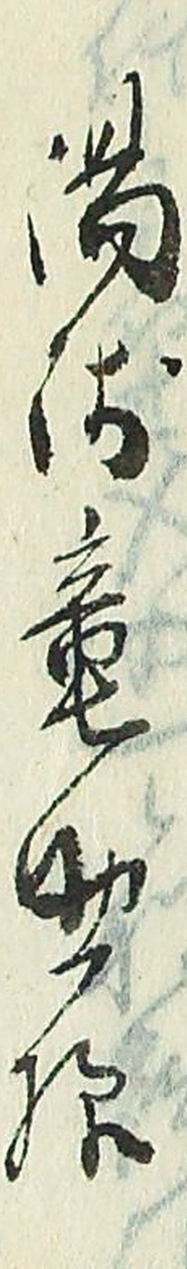湯浅竜助様
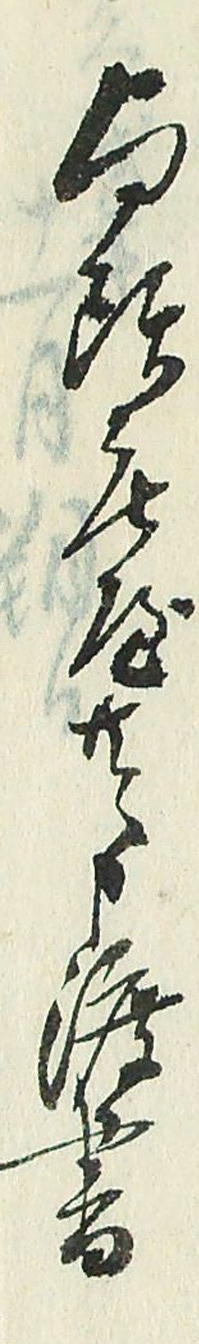与頭庄屋共へ申渡書
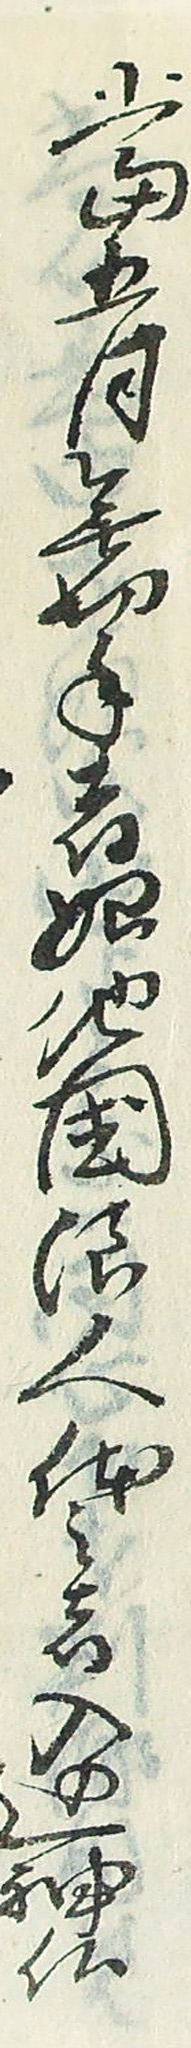當五月無切手者始他国浪人体之者入込神仏
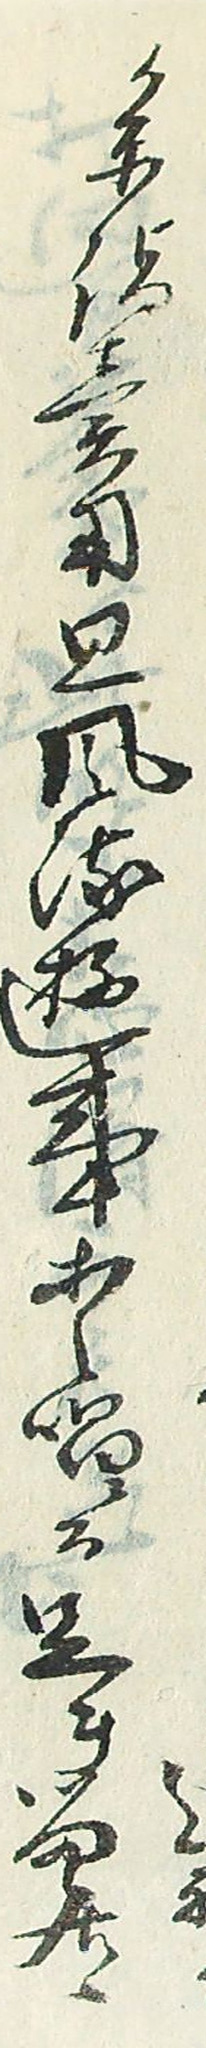参詣賣用且風流遊事等之唱ニ而足ヲ留居候
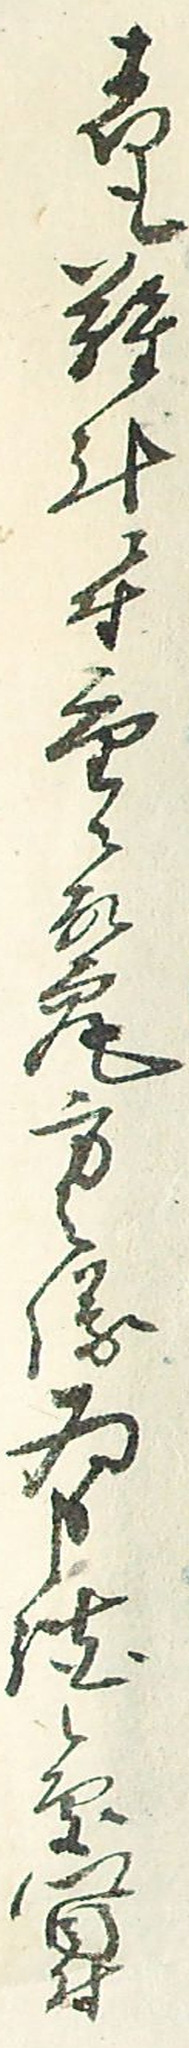者も難計ニ付重々取究方之儀為申聴候處郷目付

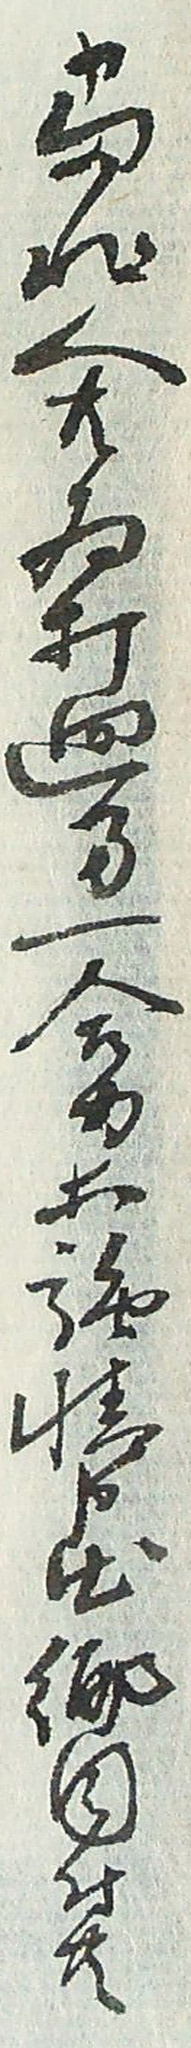番非人共為打廻万一合力等強情申出郷目付共
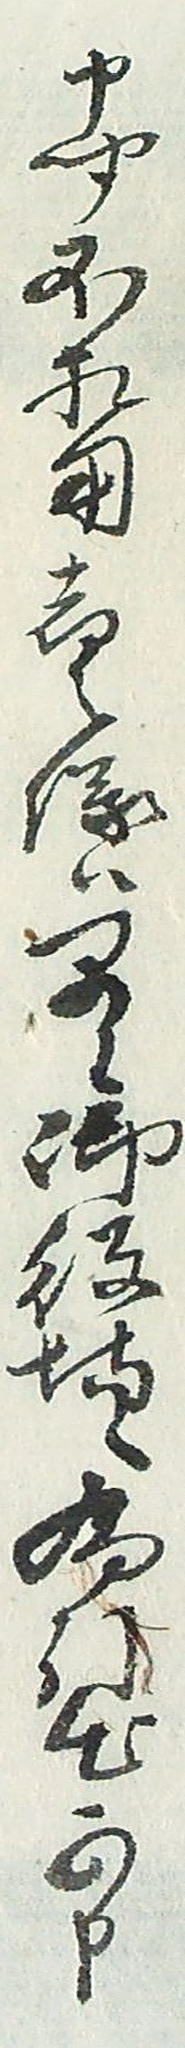申聞不相用者之儀ハ早々御役場へ為引出可申
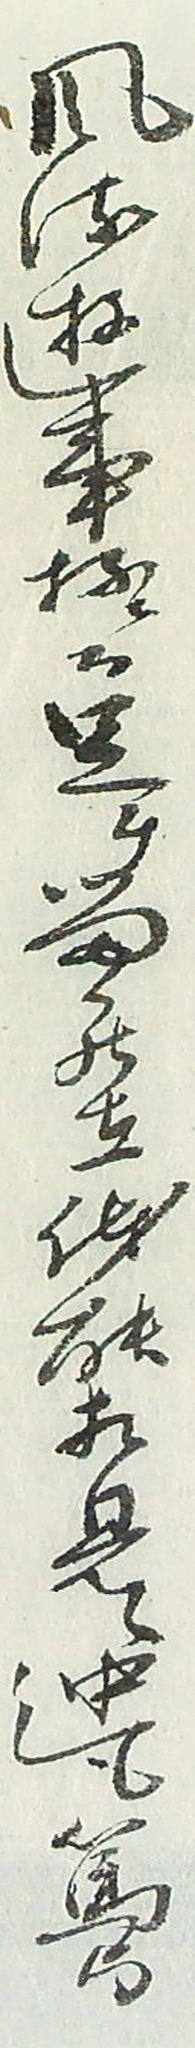風流遊事抔ニ而足ヲ留罷在体能相見候迚も篤と
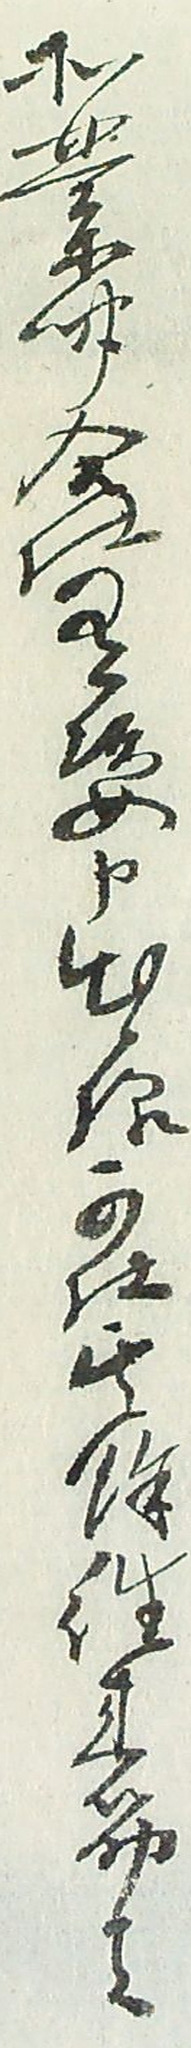所業聞合仕有姿申出候様可仕其餘往来筋者
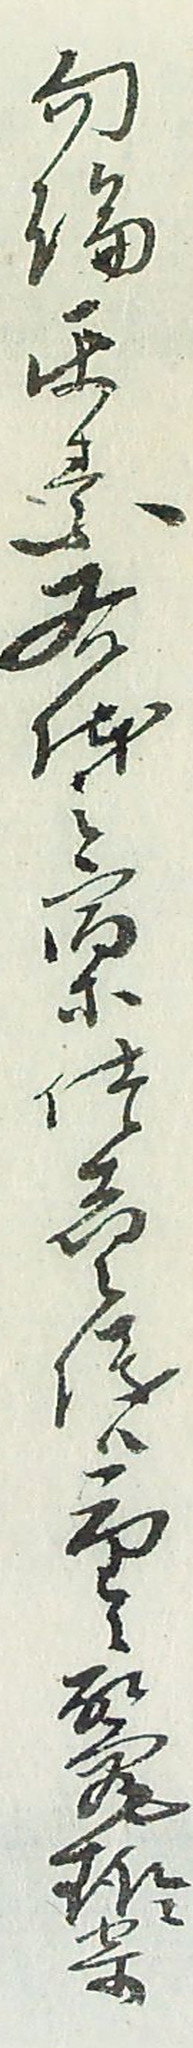勿論平素右体之宿等仕候者之儀ハ重々取究趣ニ寄
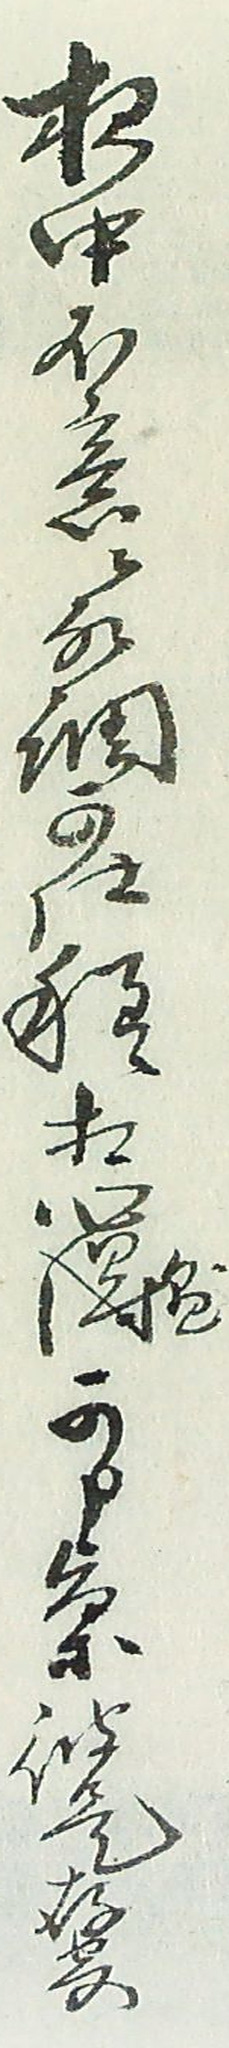夜中不意ニ取調可仕程ニ相心得懸可申旨等彼是存寄
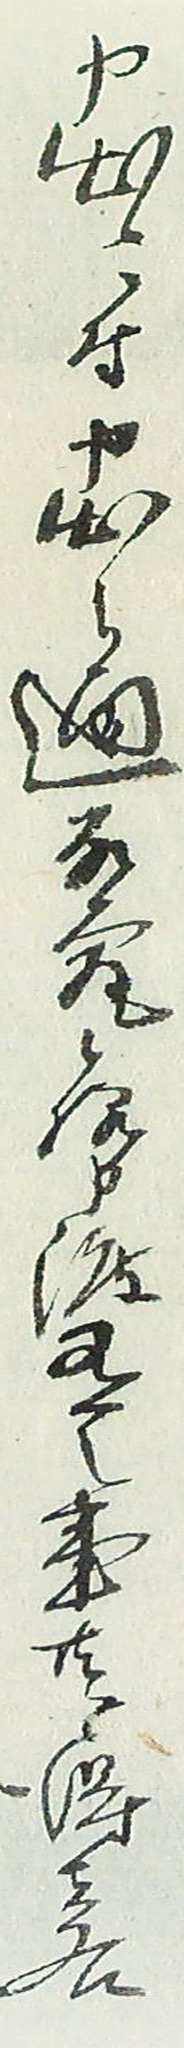申出候ニ付申出之通取究候様申渡有之事共ニ候得者右
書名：諸御趣意書并御下知向之写
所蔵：鳴門教育大学 Naruto University of Education
